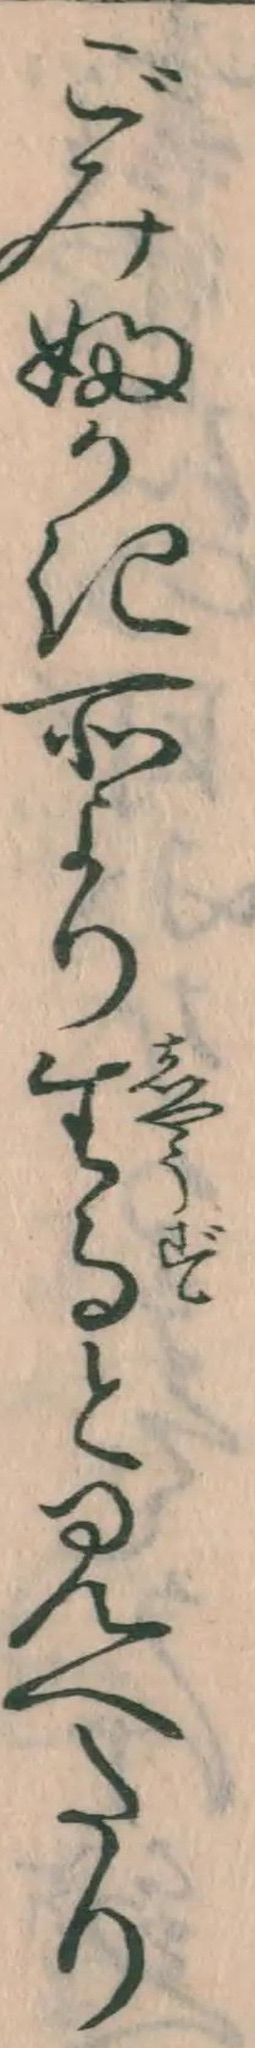ごみふかき所より生ると見へたり
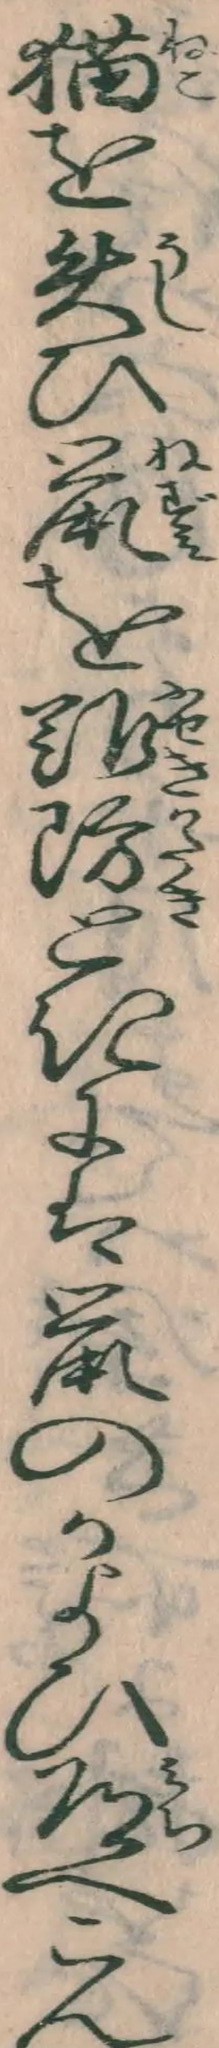猫を失ひ鼠を難防ときには鼠のかよひ道へこん
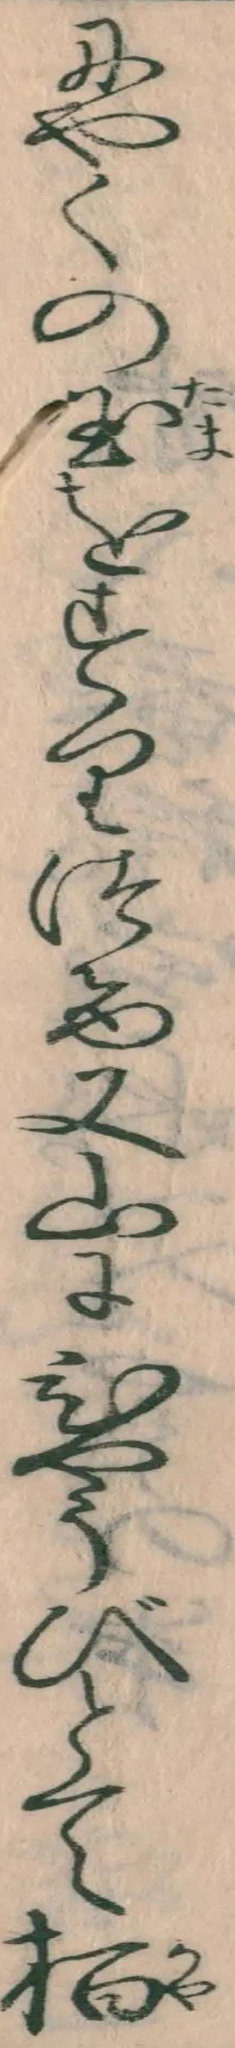にやくの玉をすりつけ又山にひやうびとて栢
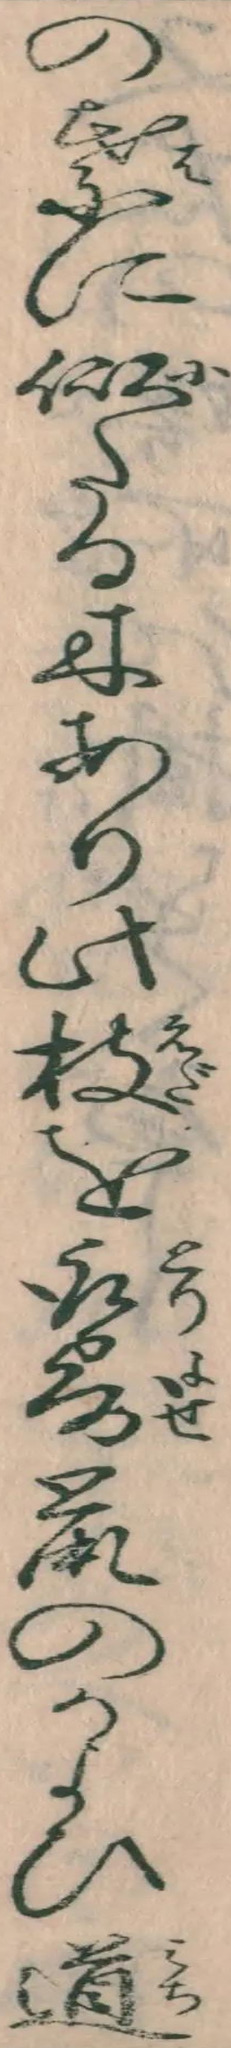の葉に似たる木あり此枝を取寄鼠のかよひ道
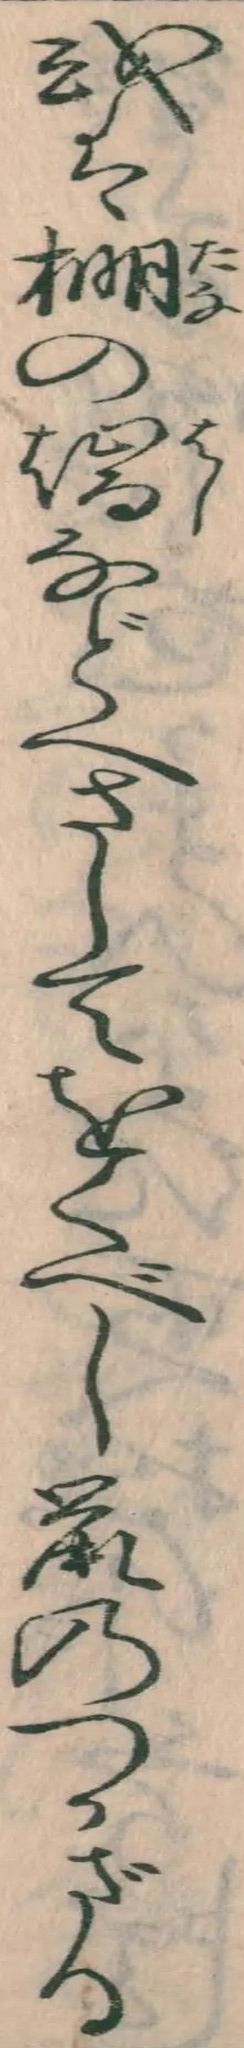或は棚の端などへさしてをくべし鼠のつかざる
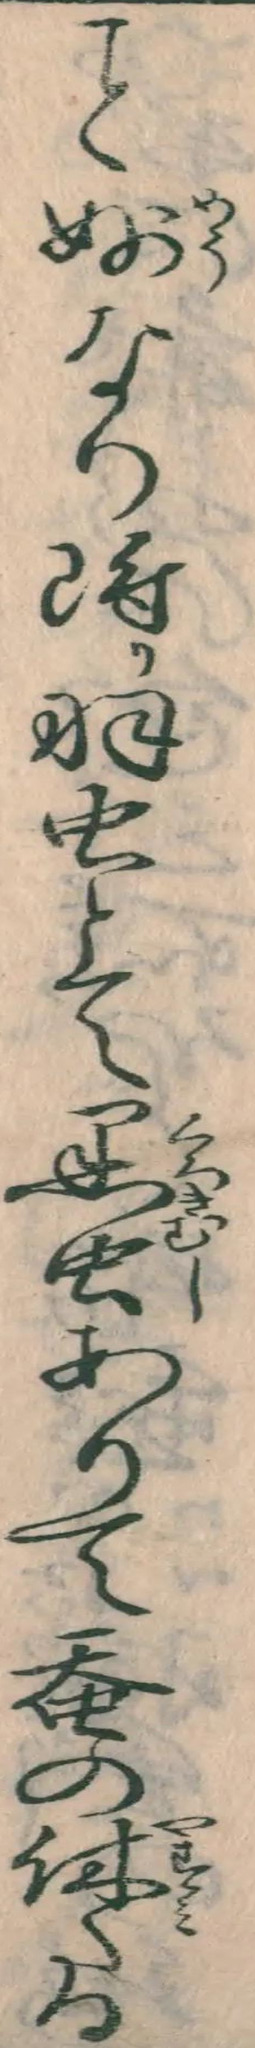こと妙なり附り羽虫とて黒虫ありて蚕の休たる
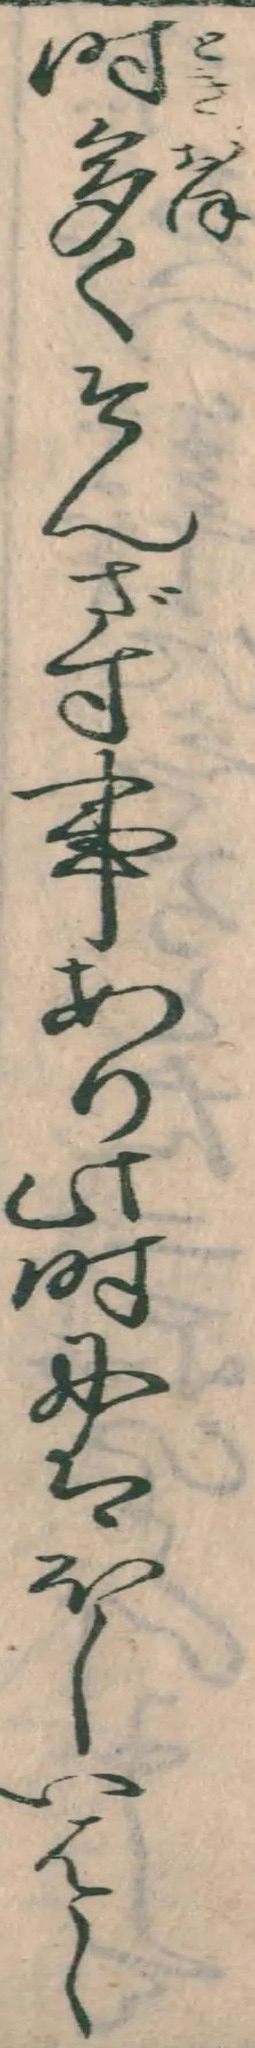時多くそんざす事あり此時にはほしいはし

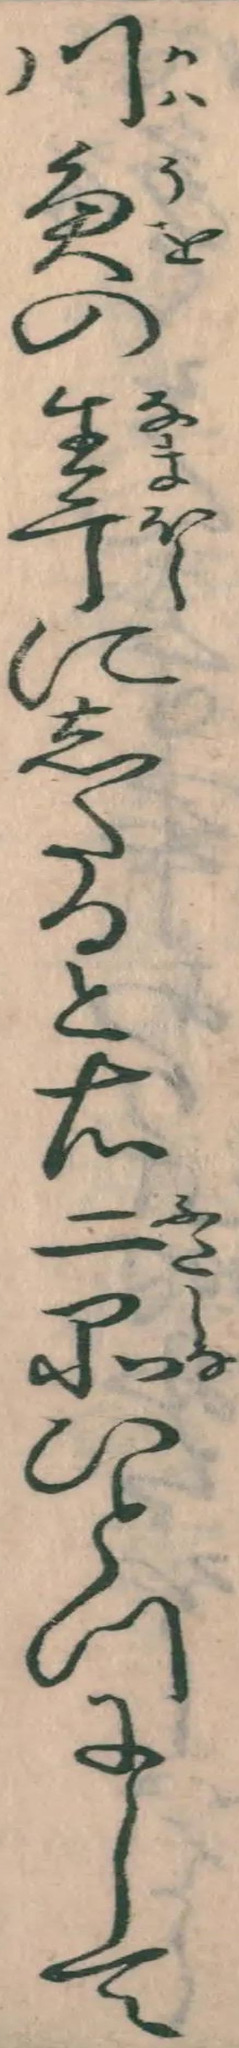川魚の生干にしたると右二品ひとつにして
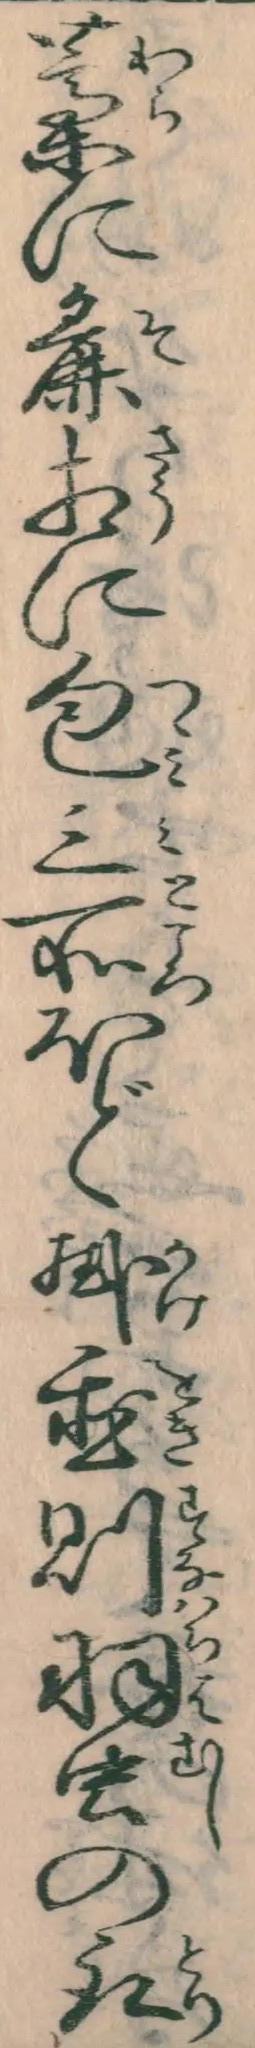藁に麁相に包三所ほど掛置則羽虫の取
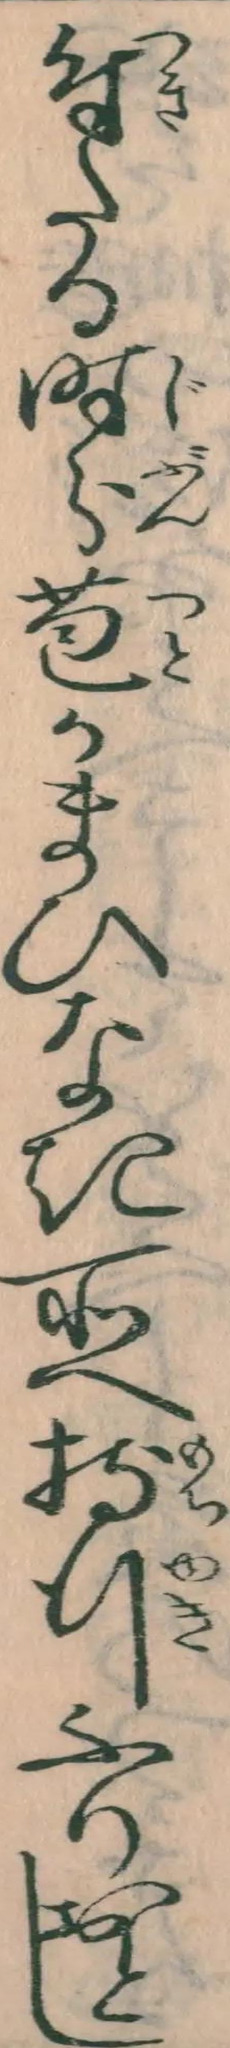付たる時分苞かまひなき所へ持行ふりおとし
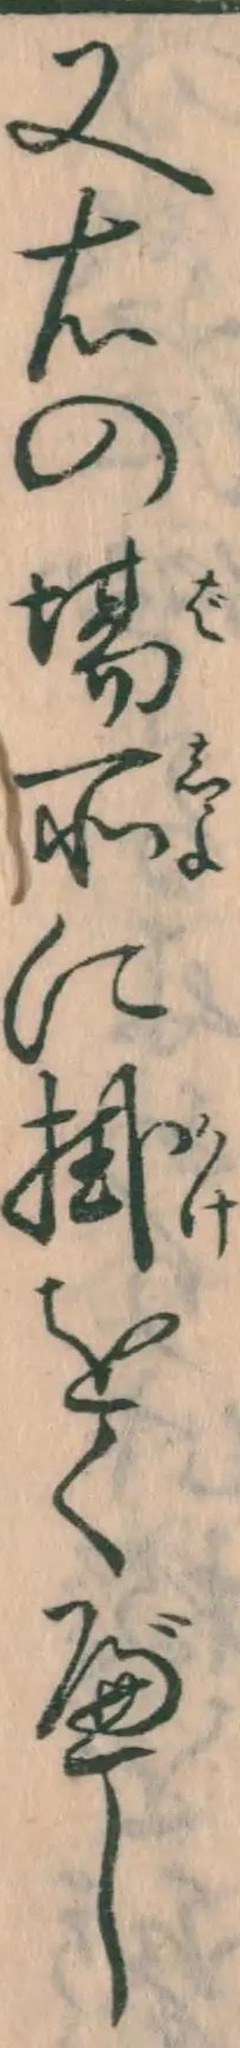又右の場所に掛をくべし
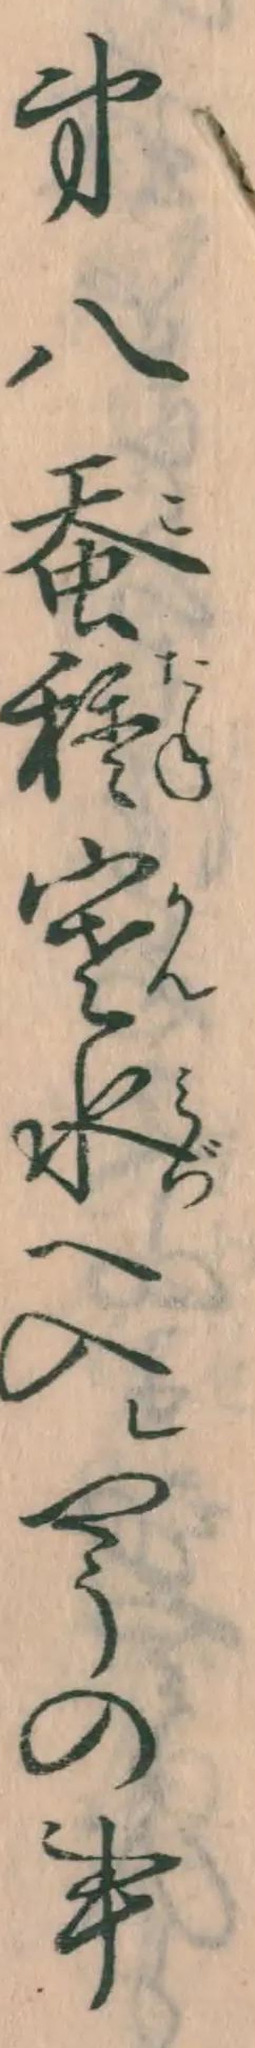第八蚕種寒水へ入れやうの事
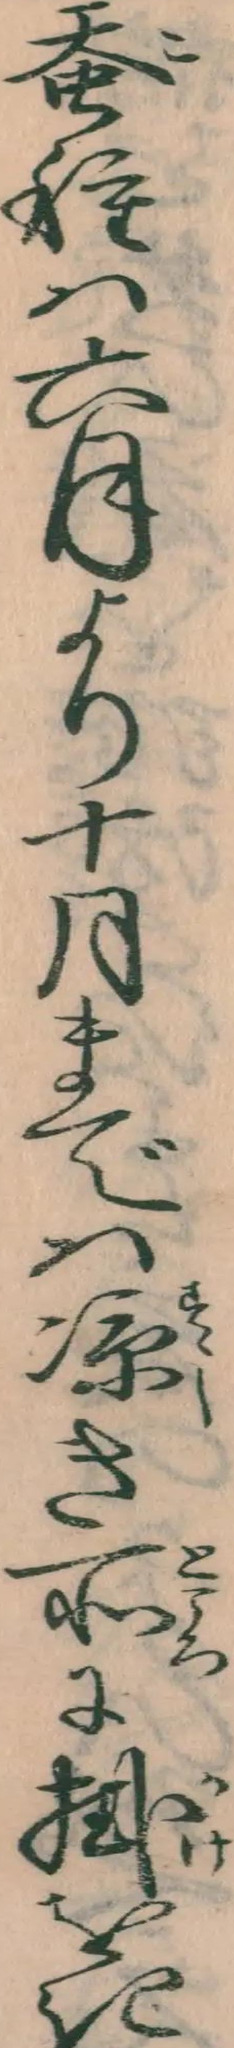蚕種は六月より十月までは涼き所に掛をき
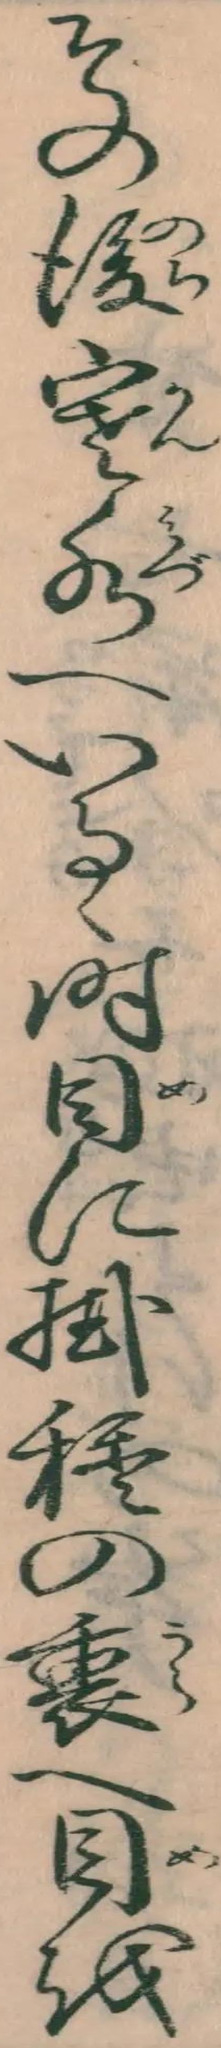その後寒水へいるゝ時目に掛種の裏へ目を
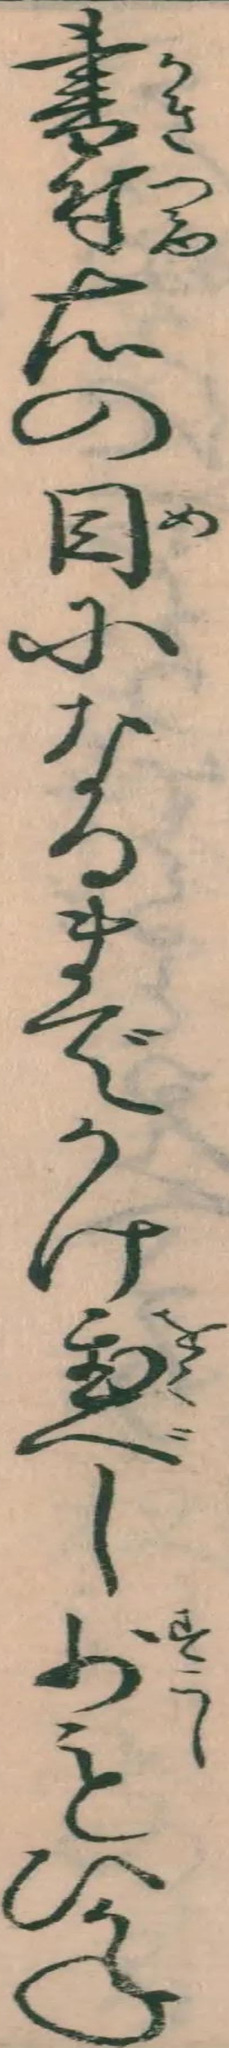書付右の目になるまでかけ置べし少もひかね
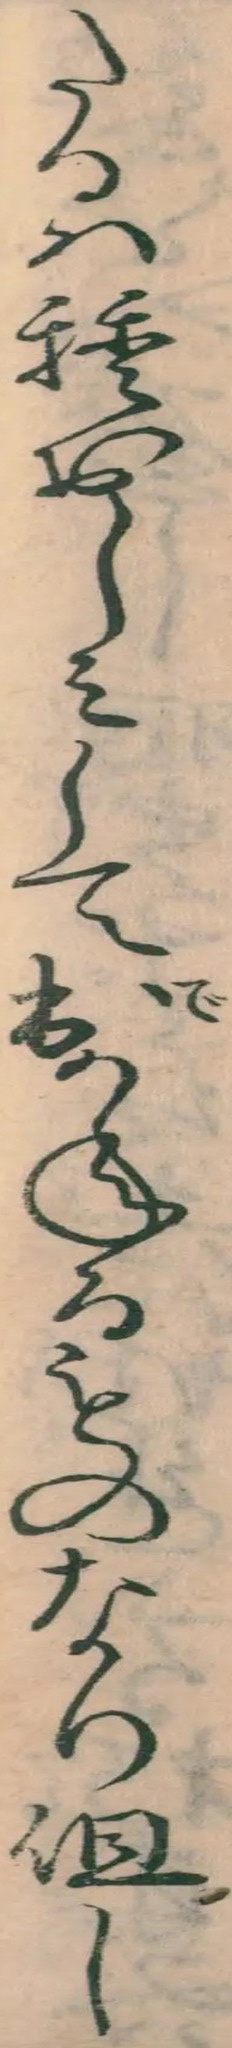たるは種おしみして出かねるものなり但し
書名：新撰養蚕秘書
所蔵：国立国会図書館 National Diet Library, JAPAN
